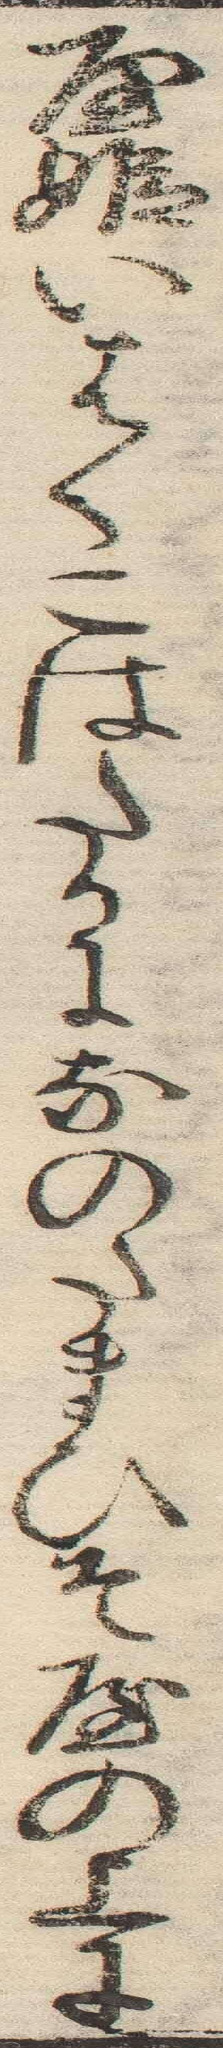や姫いはくこはたかになのたまひそ屋の上に
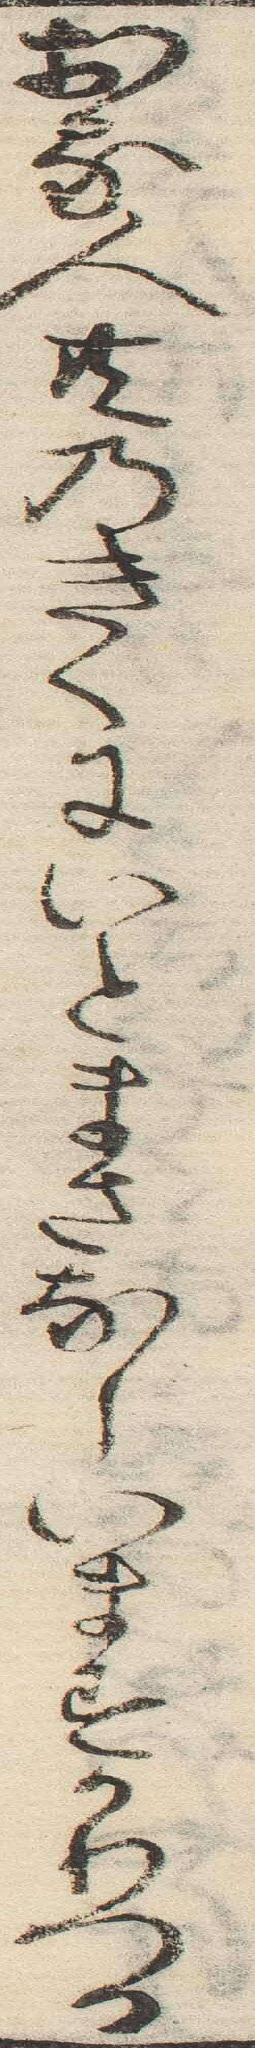おる人共のきくにいとまさなしいますかりつる
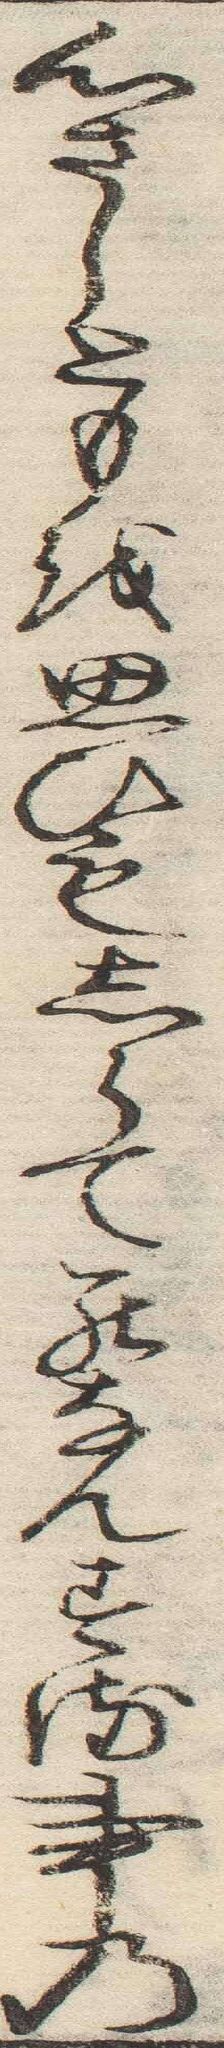心さしともを思ひもしらて罷なんする事の
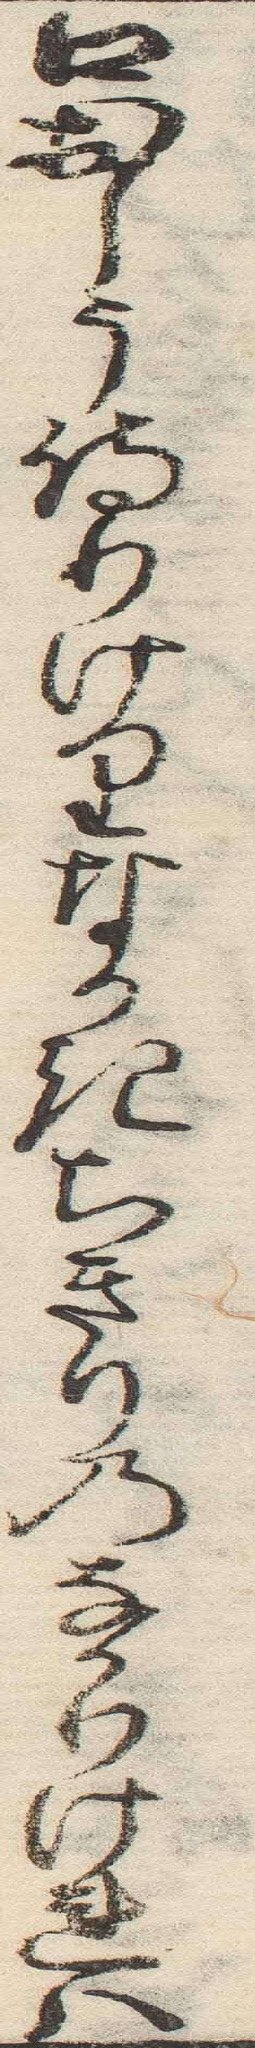口おしう侍りけりなかきちきりのなかりけれは
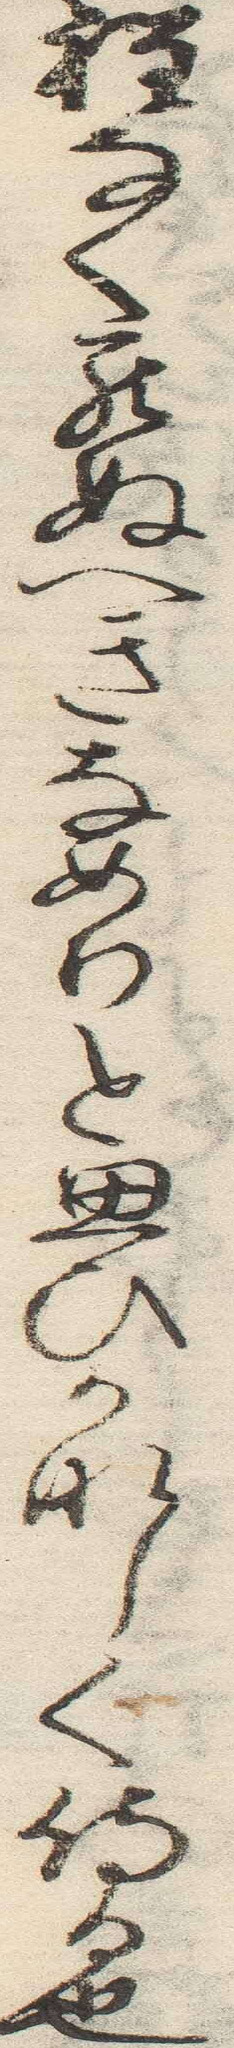程なく死ぬへきなめりと思ひかなしく侍る也
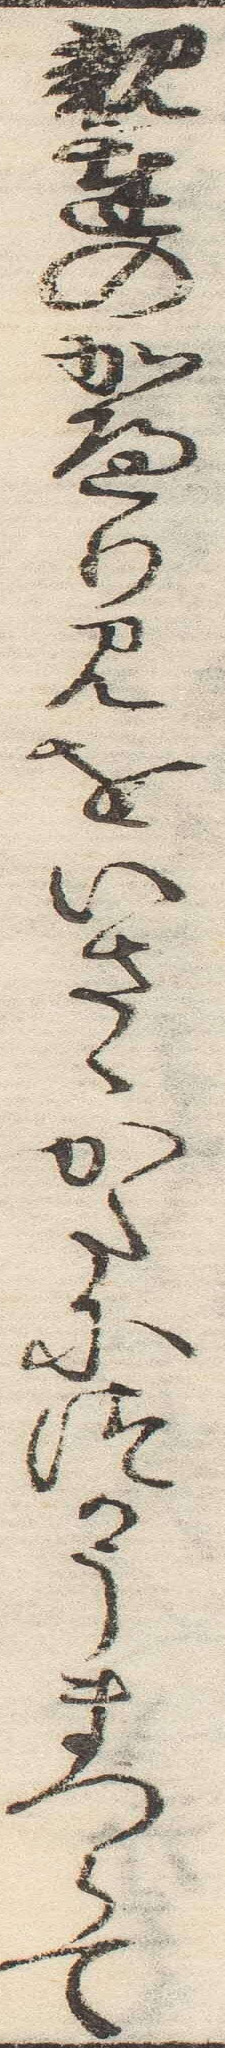親達のかへりみをいさゝかたにつかうまつらて
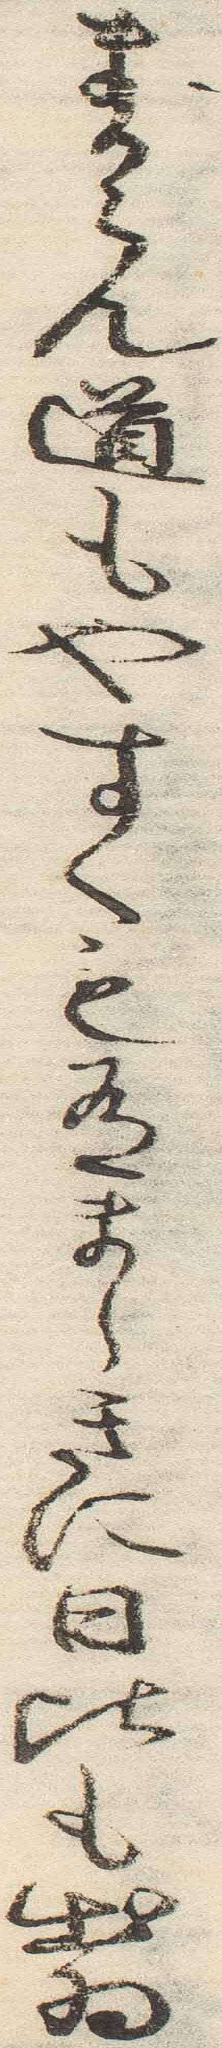まからん道もやすくも有ましきに日頃も出ゐ
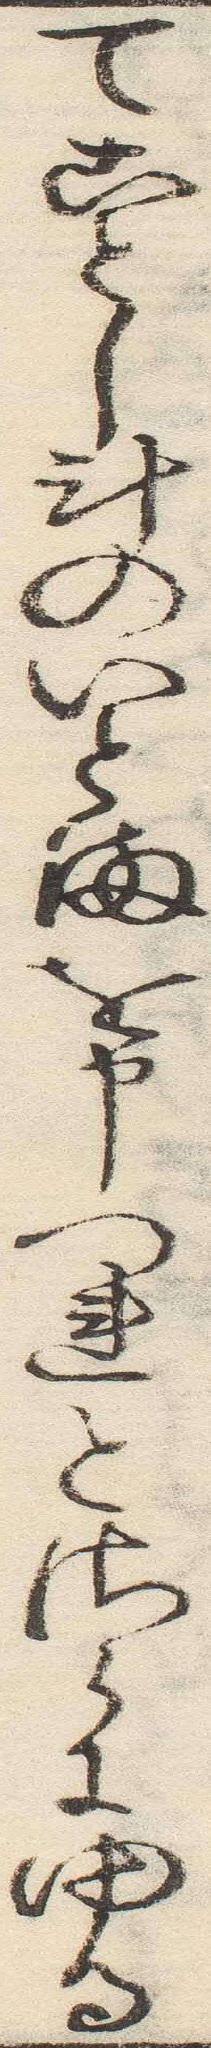てことし計のいとまを申つれとさらにゆる
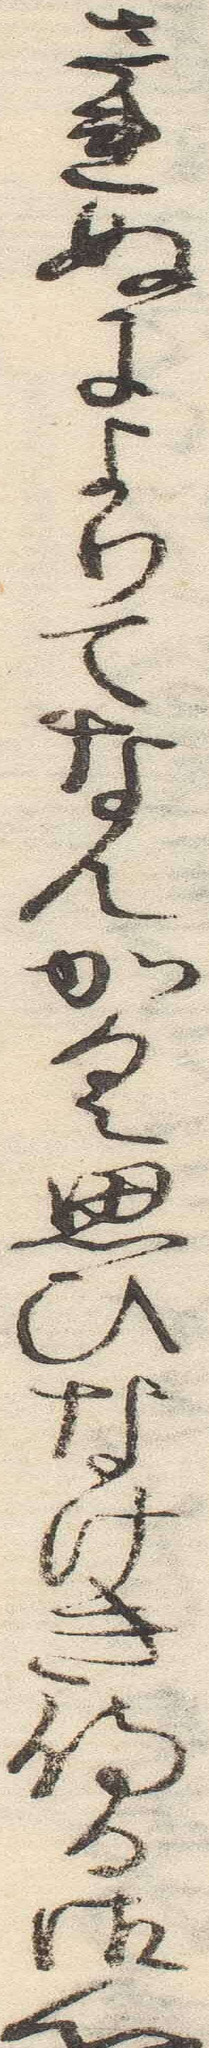されぬによりてなんかく思ひなけき侍る御心
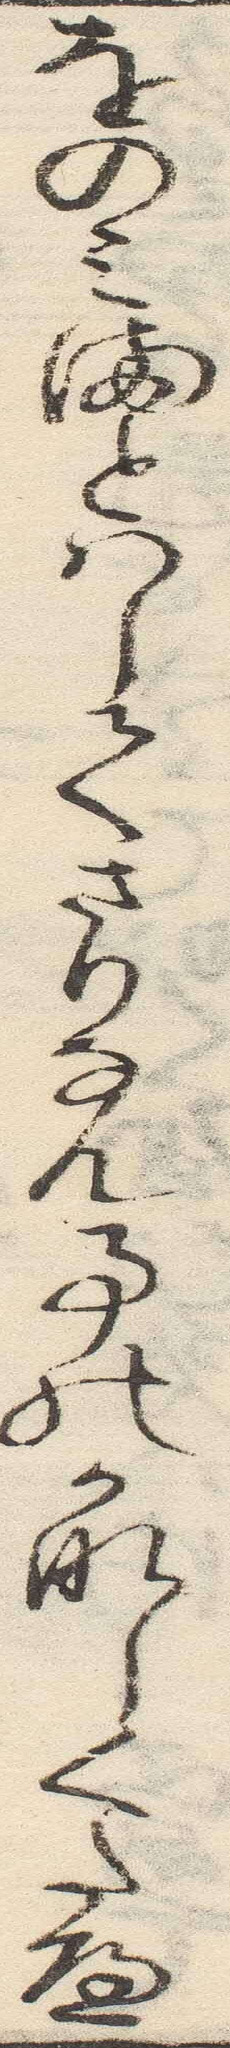をのみまとはしてさりなん事のかなしくたへ
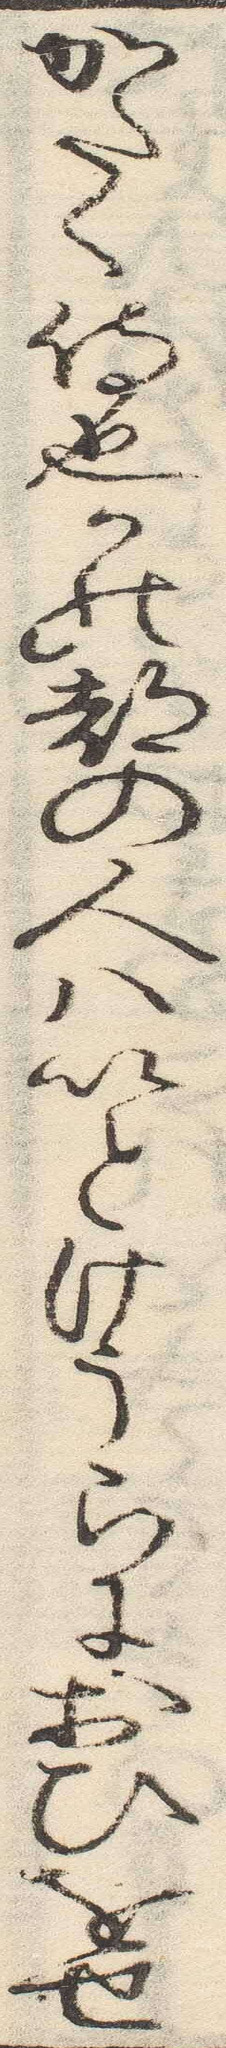かたく侍也かの都の人はいとけうらにおひをせ
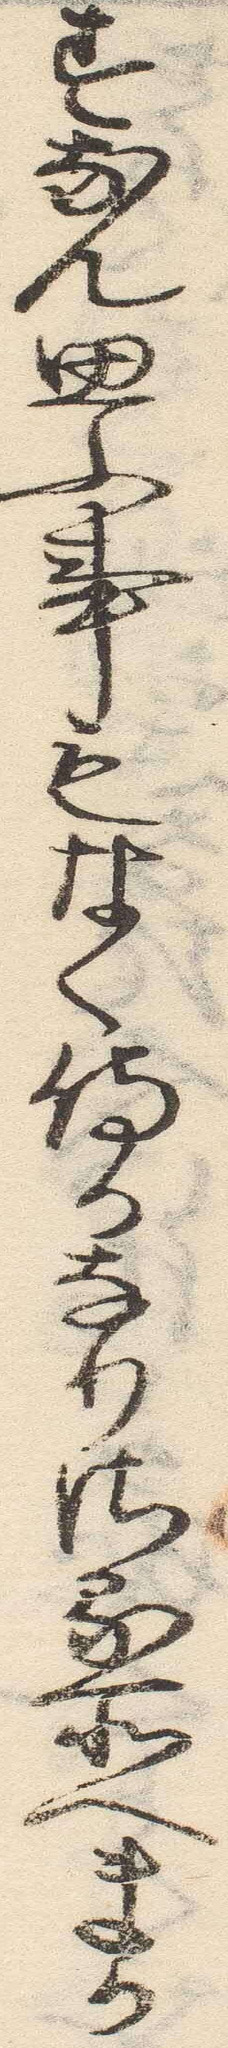すなん思ふ事もなく侍るなりさる所へまか
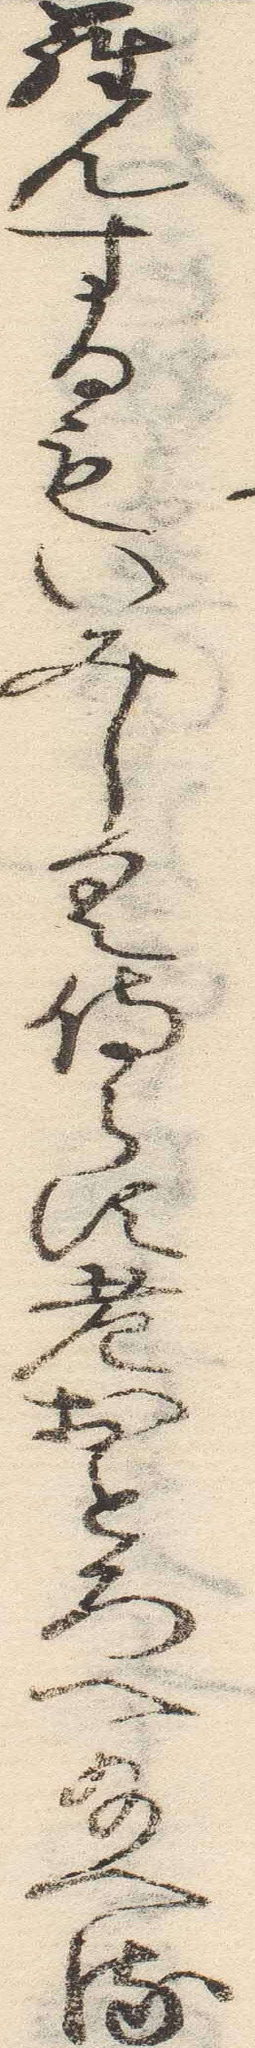らんするもいみしく侍らす老おとろへ給へる
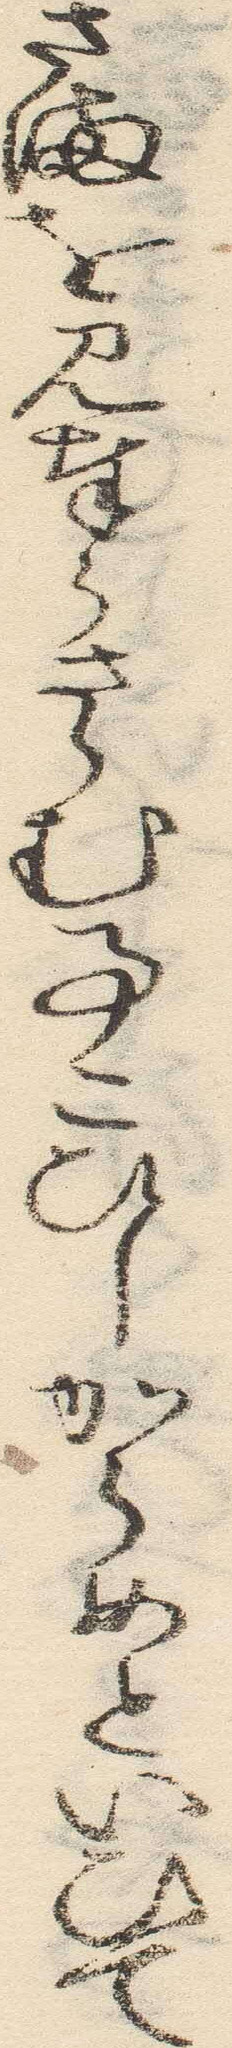さまを見奉らさらむ事こひしからめといひて
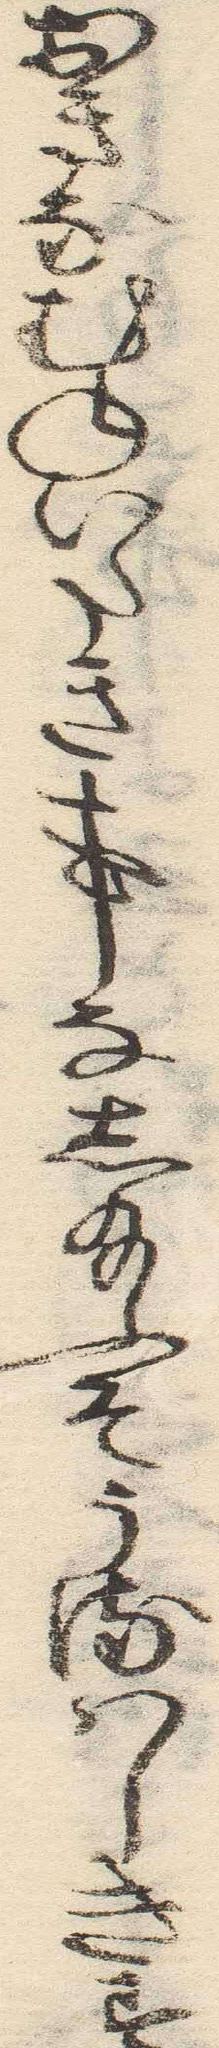おきなむねいたき事なし給ふそうるはしきす
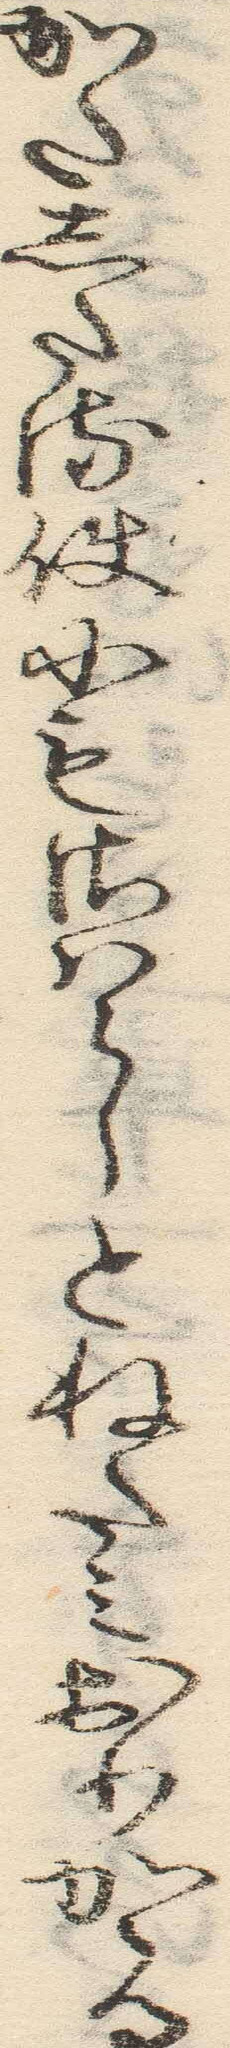かたしたる使にもさはらしとねたみおりかゝる
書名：竹取物語
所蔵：東京学芸大学附属図書館 国文学研究資料館
